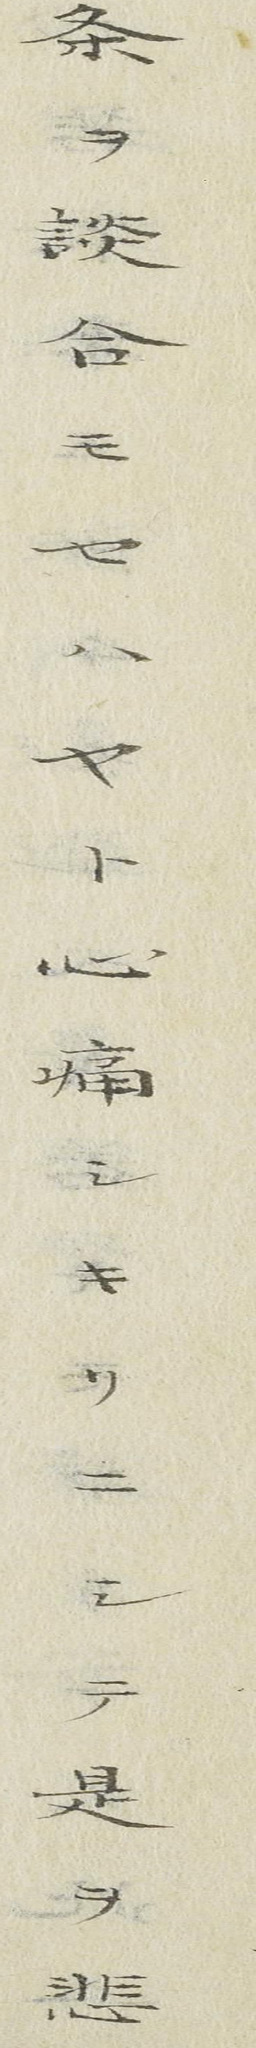条ヲ談合モセハヤト心痛シキリニシテ是ヲ悲
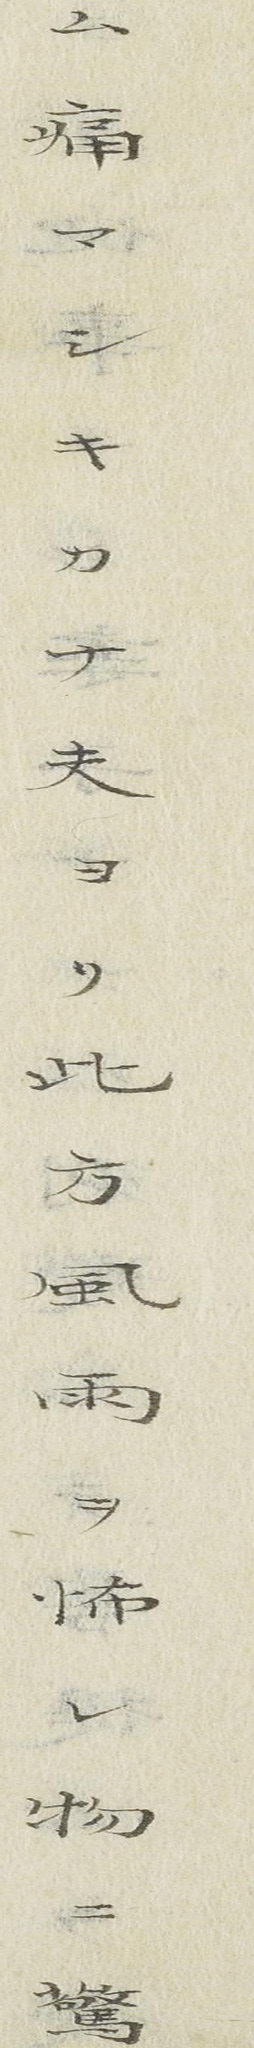ム痛マシキカナ夫ヨリ此方風雨ヲ怖レ物ニ驚
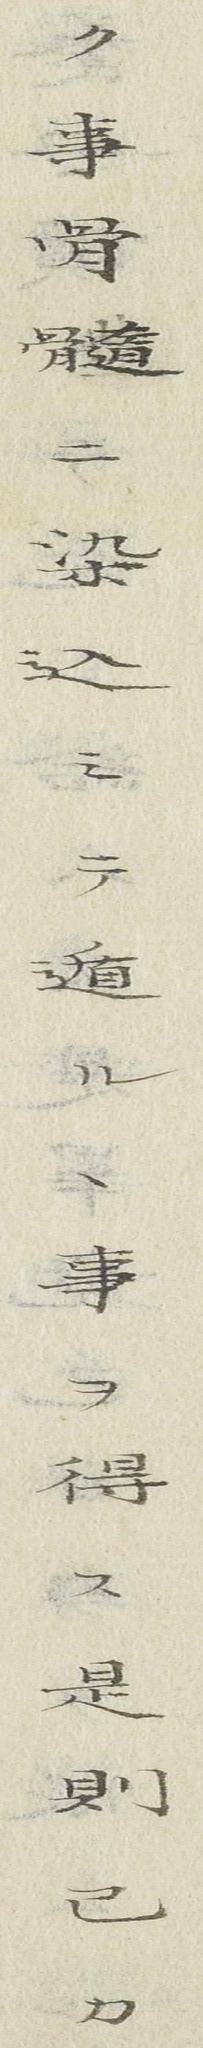ク事骨髄ニ染込ミテ遁ルヽ事ヲ得ス是則己カ
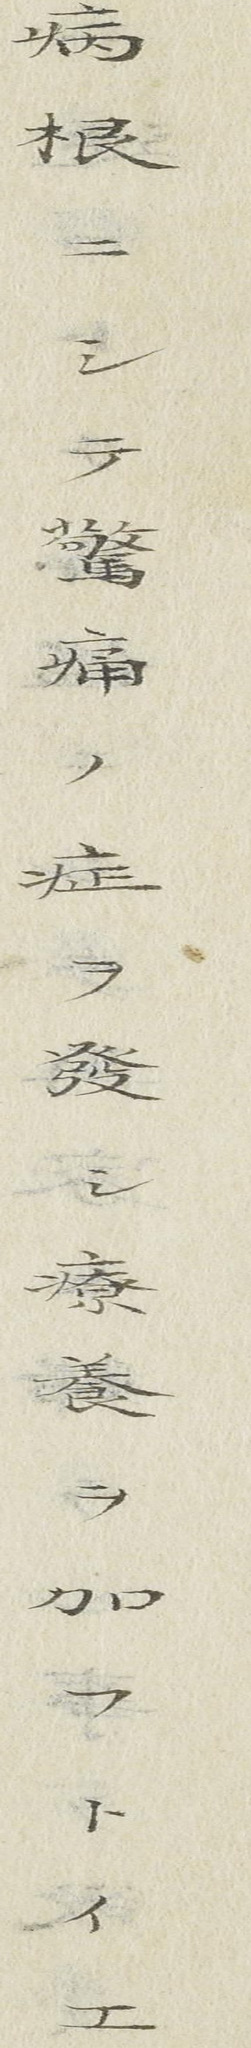病根ニシテ驚痛ノ症ヲ発シ療養ヲ加フトイエ
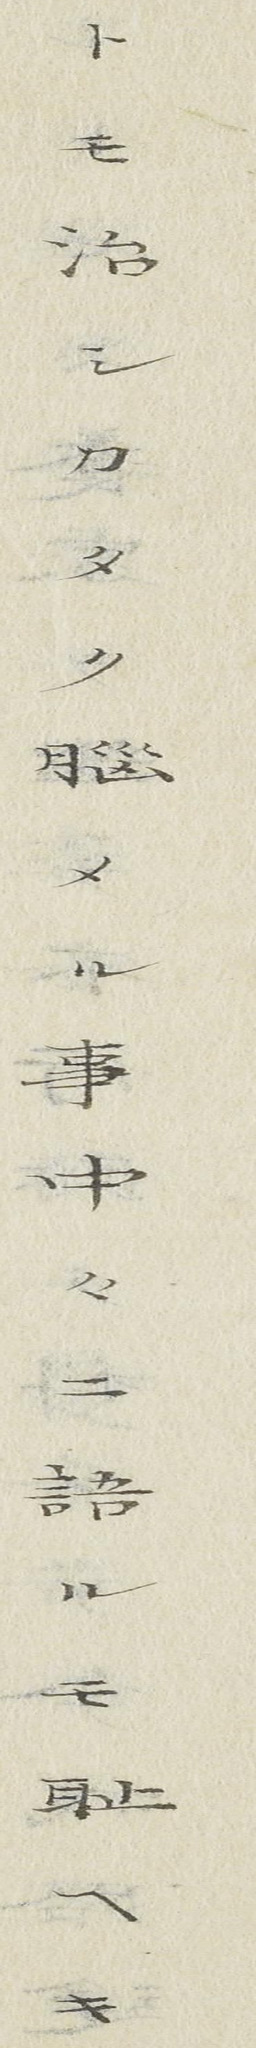トモ治シカタク脳メル事中々ニ語ルモ恥ヘキ
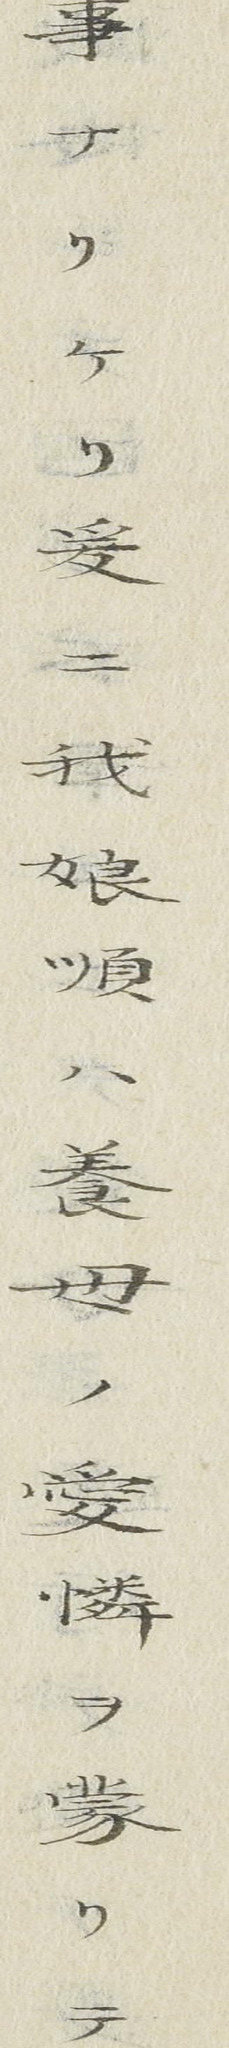事ナリケリ爰ニ我娘順ハ養母ノ愛憐ヲ蒙リテ
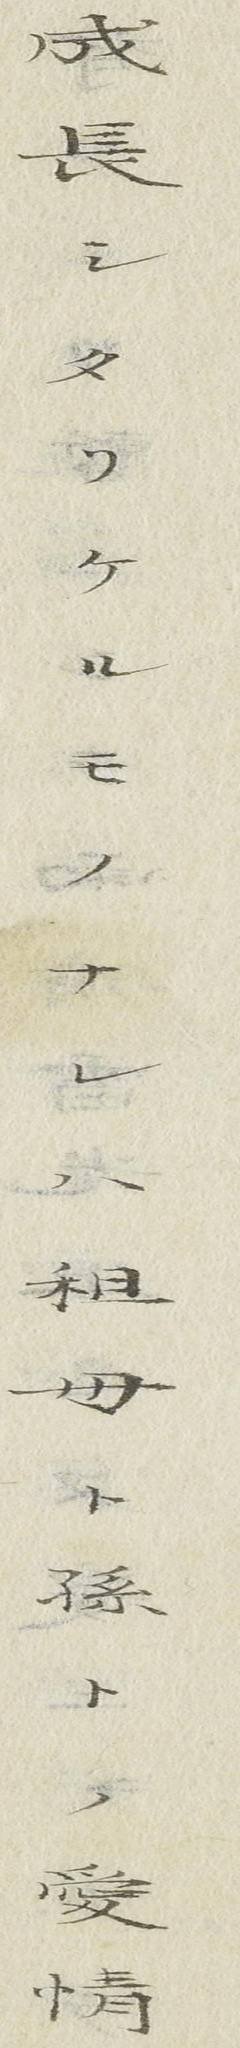成長シタリケルモノナレハ祖母ト孫トノ愛情
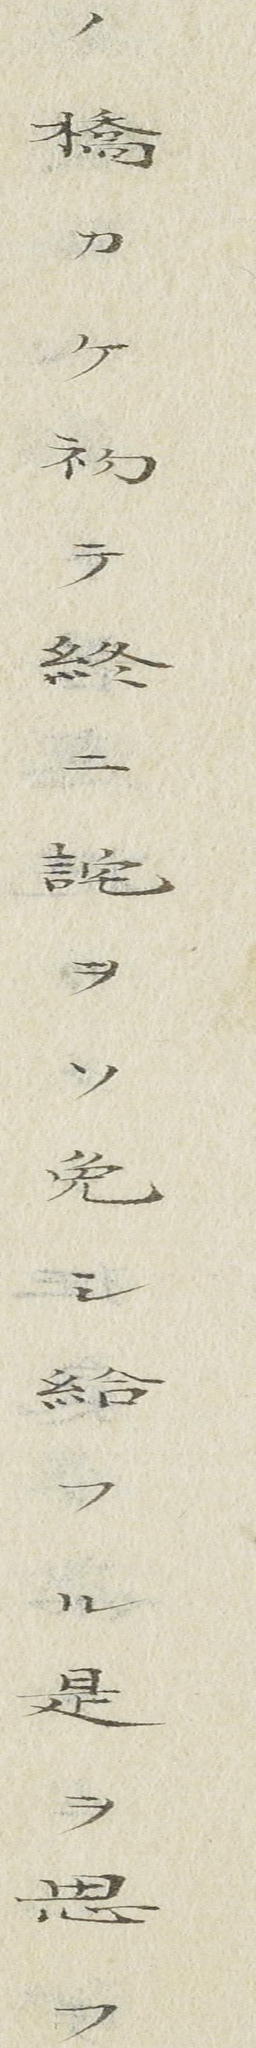ノ橋カケ初テ終ニ詫ヲソ免シ給フル是ヲ思フ
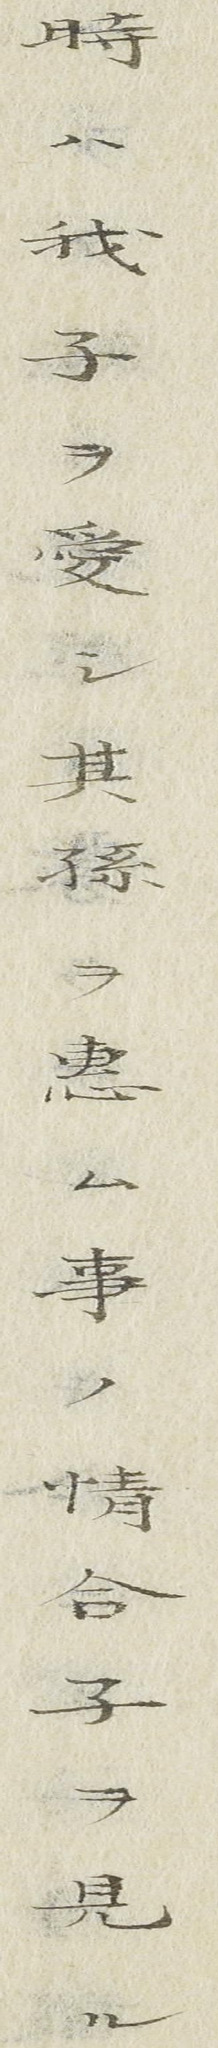時ハ我子ヲ愛シ其孫ヲ恵ム事ノ情合子ヲ見ル
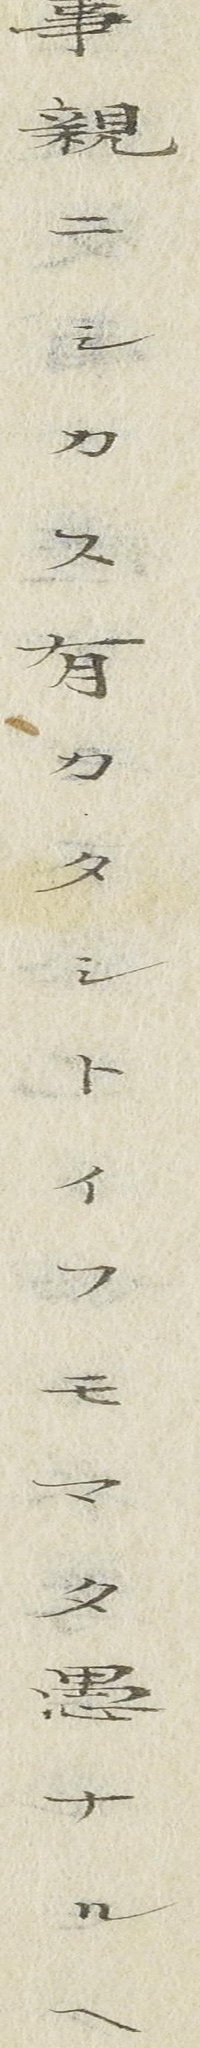事親ニシカス有カタシトイフモマタ愚ナルヘ
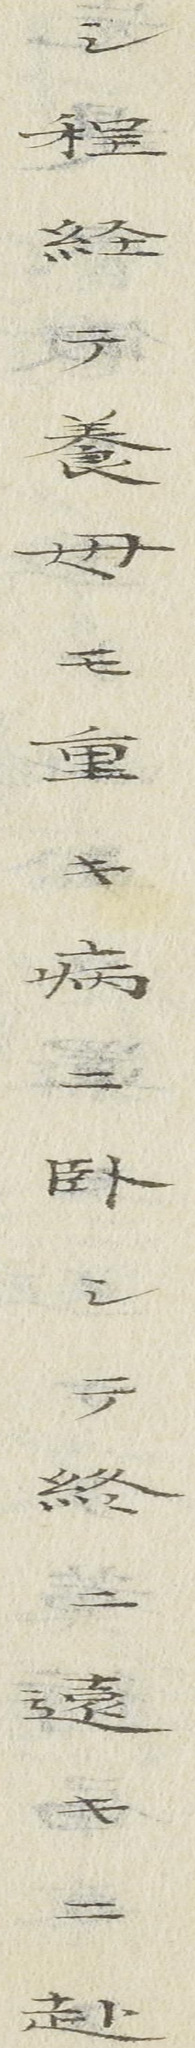シ程経テ養母モ重キ病ニ臥シテ終ニ遠キニ赴
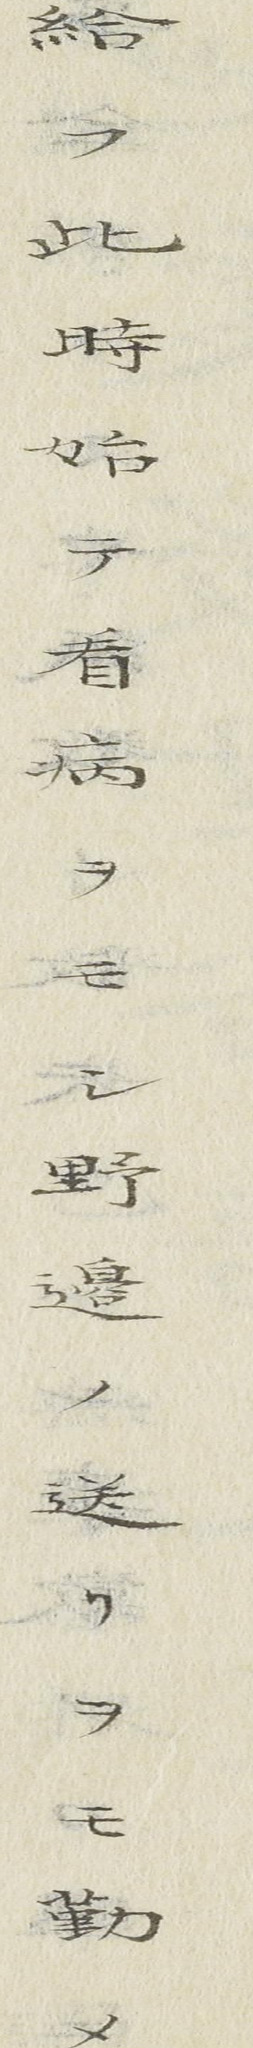給フ此時始テ看病ヲモシ野辺ノ送リヲモ勤メ
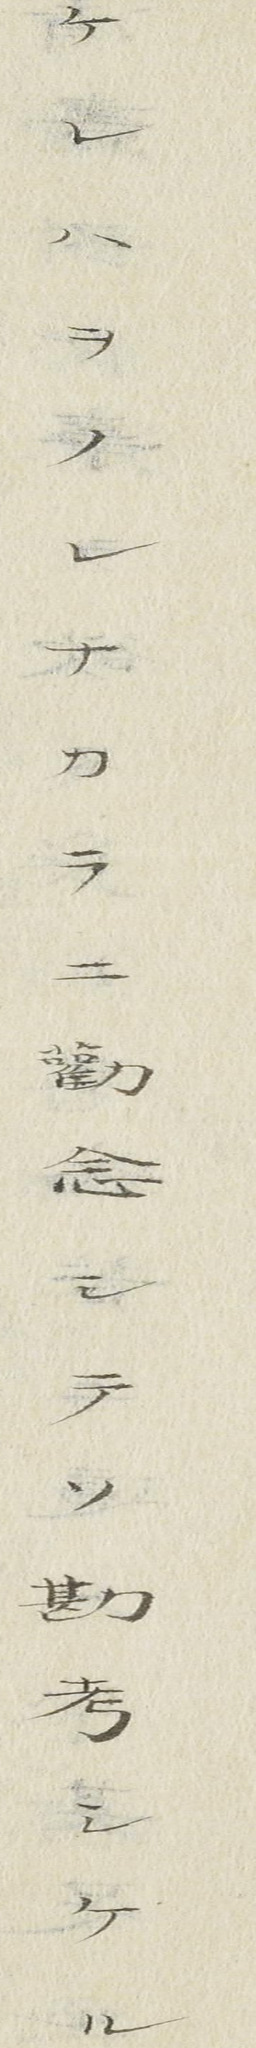ケレハヲノレナカラニ観念シテソ勘考シケル
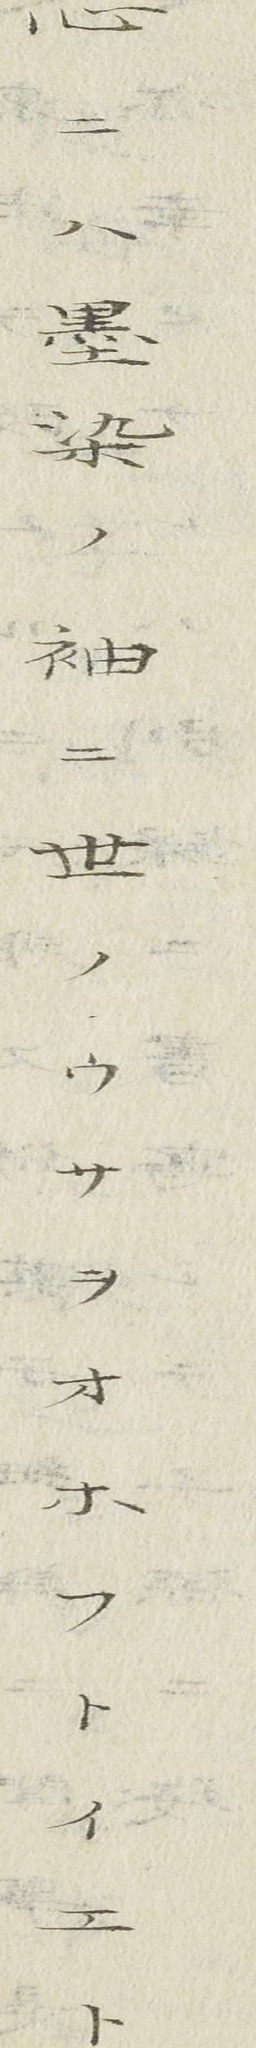心ニハ墨染ノ袖ニ世ノウサヲオホフトイエト
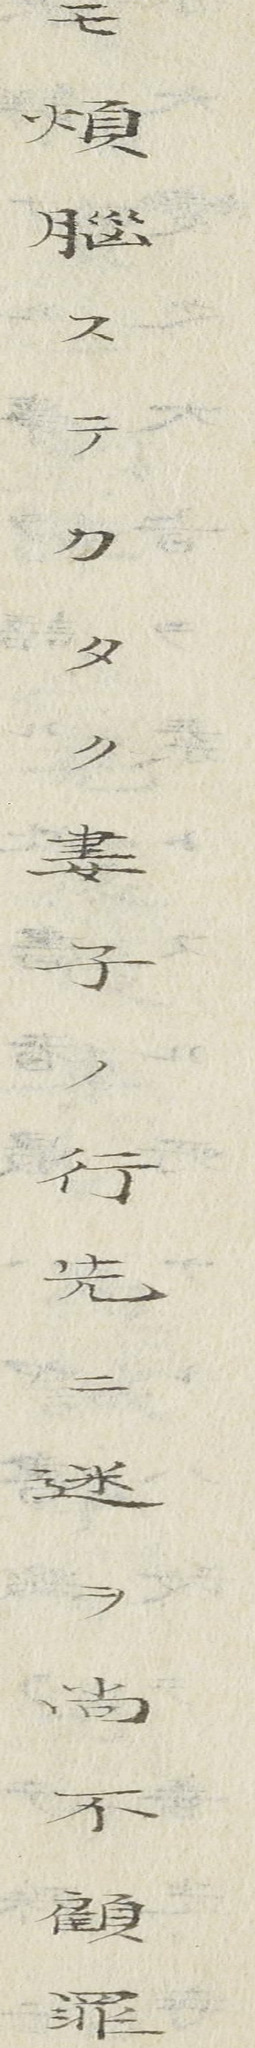モ煩脳ステカタク妻子ノ行先ニ迷ヲ尚不顧罪
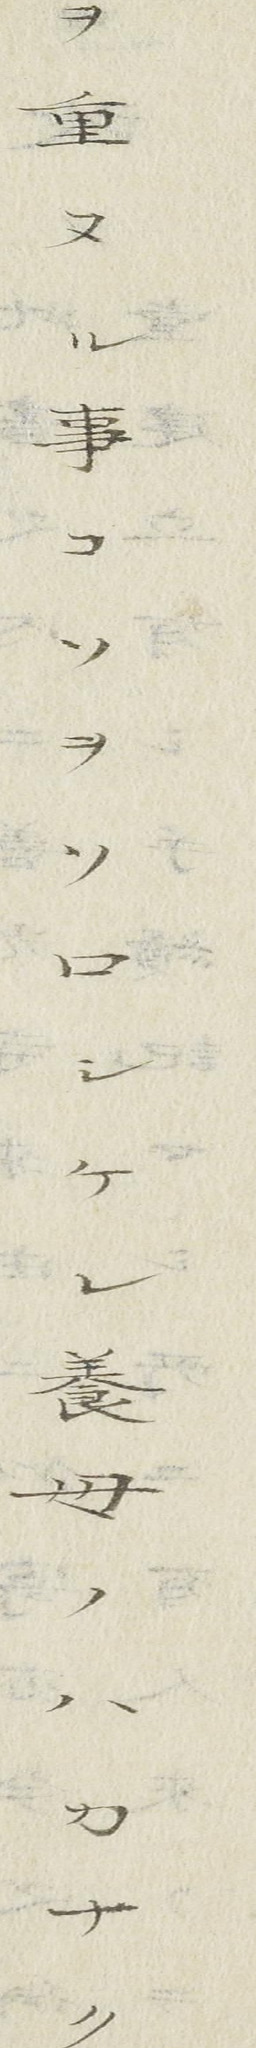ヲ重ヌル事コソヲソロシケレ養母ノハカナク
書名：地災撮要　地震之部　巻ノ二
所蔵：東京大学地震研究所図書室 Earthquake Research Institute Library, The University of Tokyo, JAPAN
